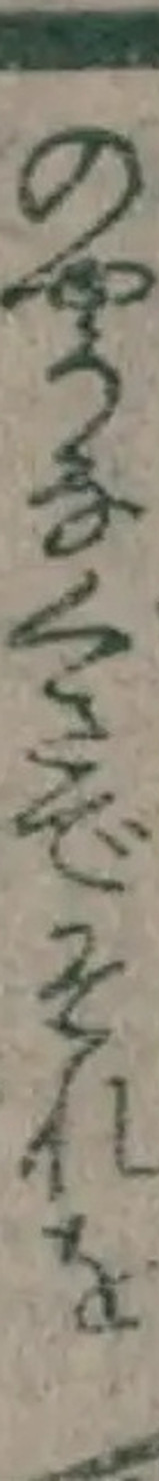のやうなくさでそれを
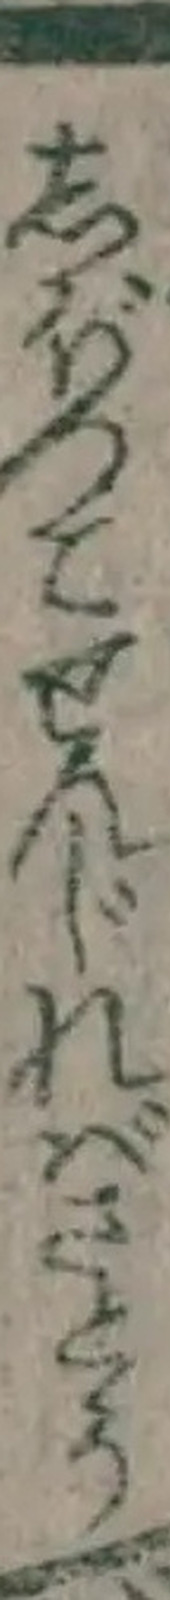しぼつてせんじればさとう
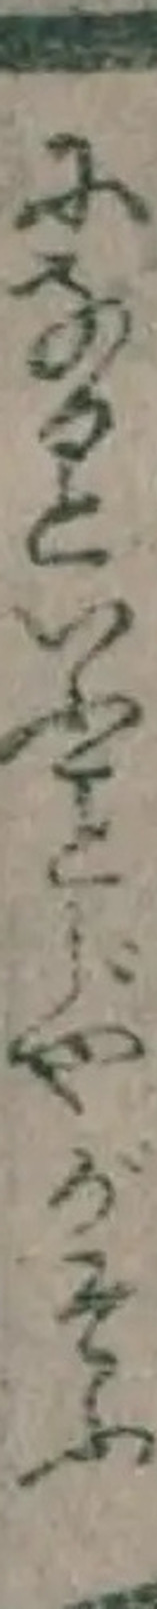になるといふことじやがそふ
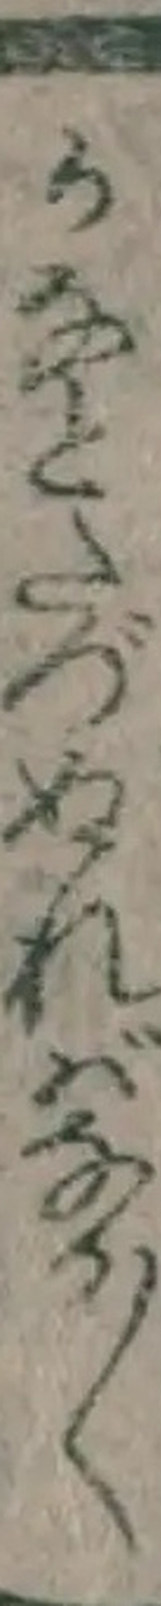かなとたづぬればなか〳〵
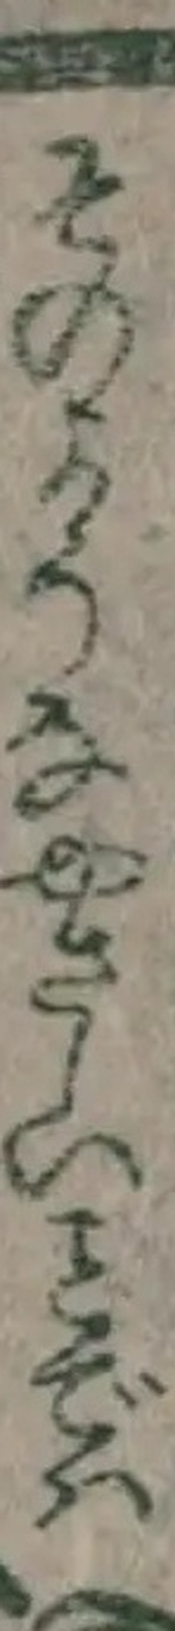そのようなやさしいことでは
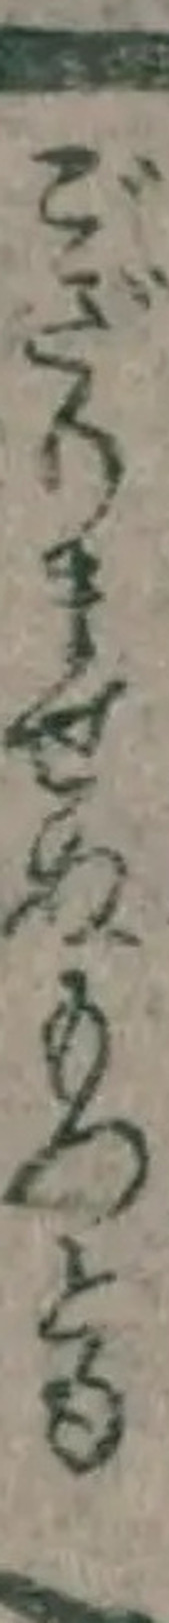ござりませぬもつとも
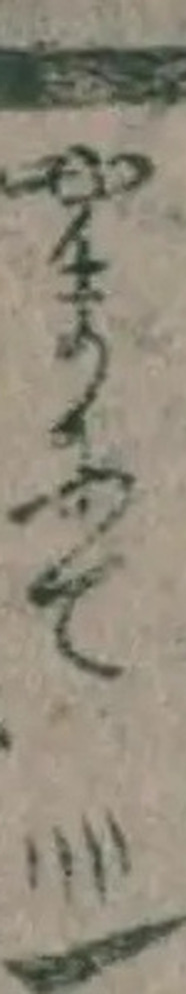やまにて
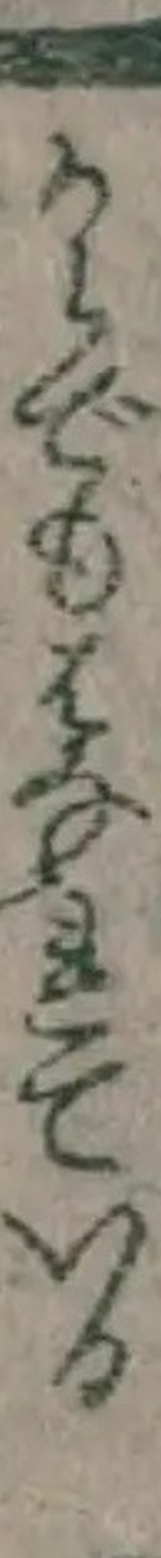からでもはなれている
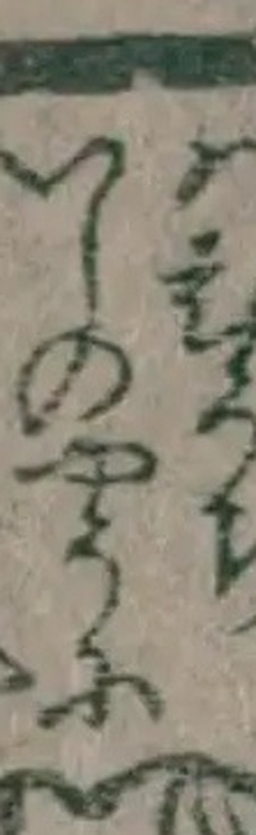いしのやうに
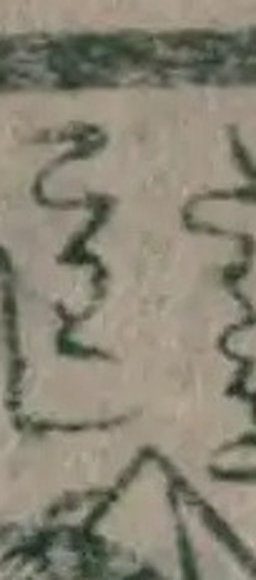こわし
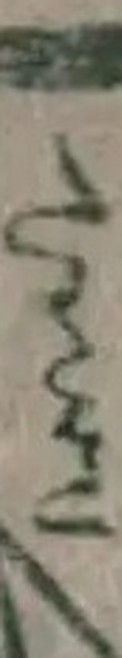たゝき
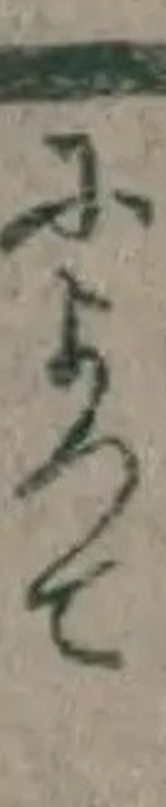によつて
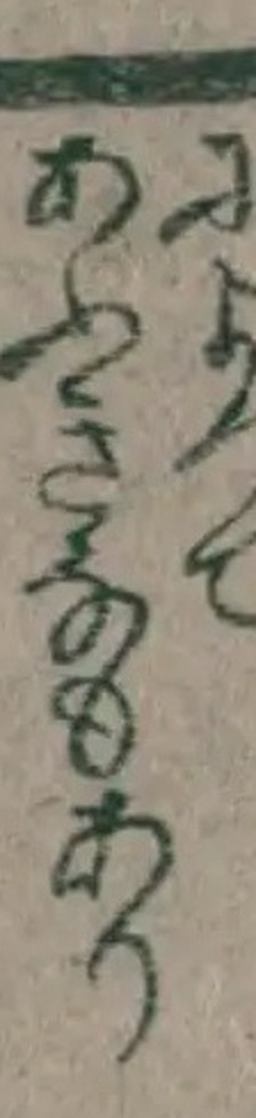あふきなもあり
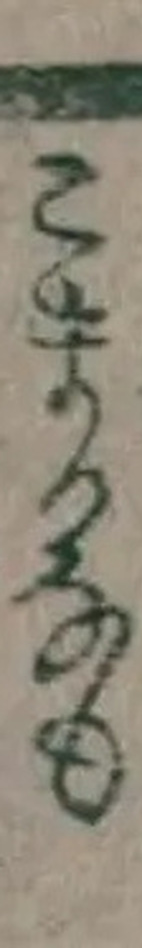こまかなも
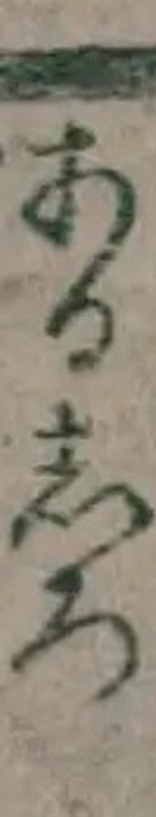あるしろ
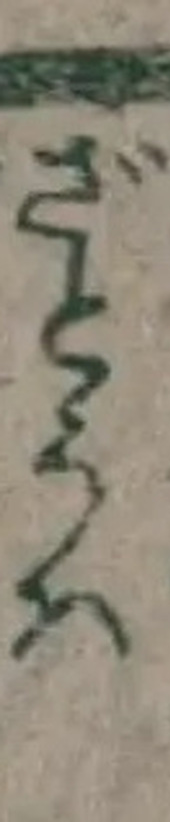ざとうは
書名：縦筒放唐の噺 3巻
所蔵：国立国会図書館 National Diet Library, JAPAN
